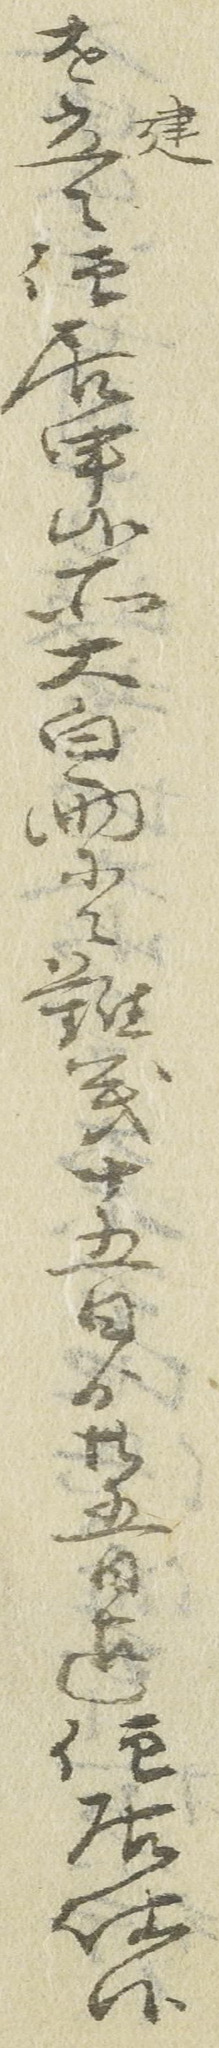を立て住居申候所大白雨にて難義十五日ゟ廿五日迄住居仕候
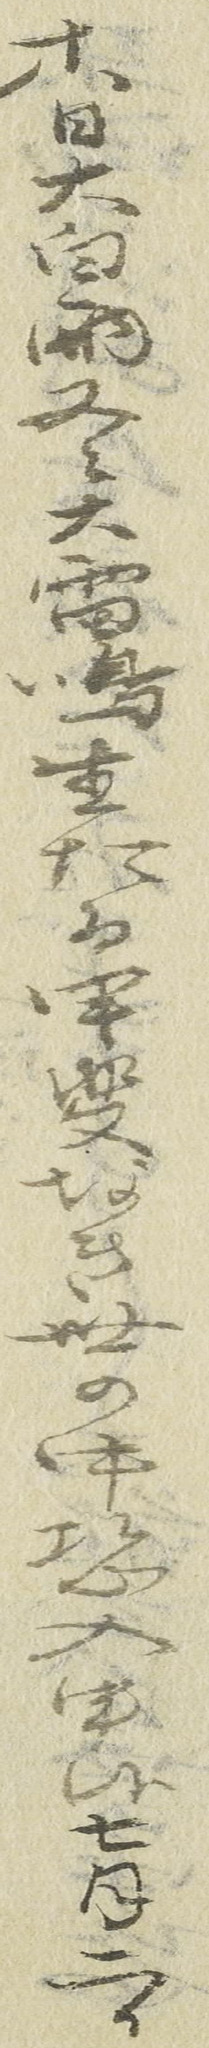十八日大白雨又〻大雷鳴生たる甲斐なき世の中恐入申候七月二日
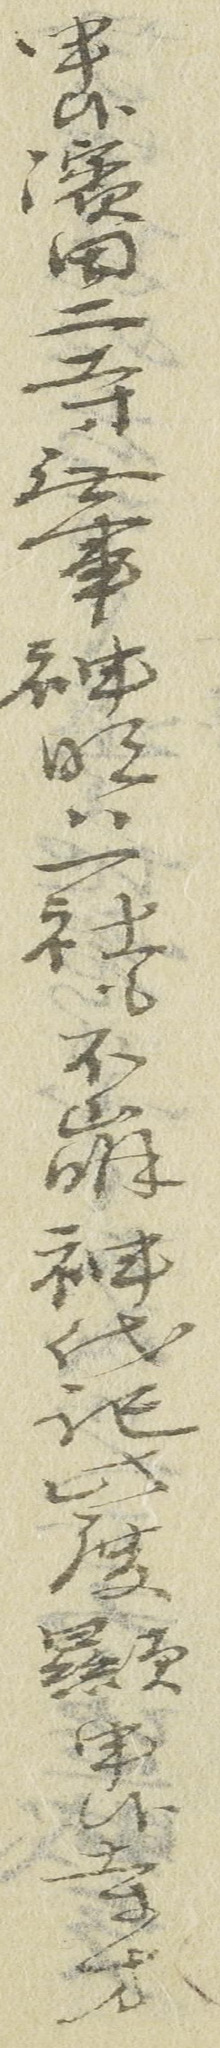申候濱田二寺無事神明は一社も不崩神代記此度顕申候寺方
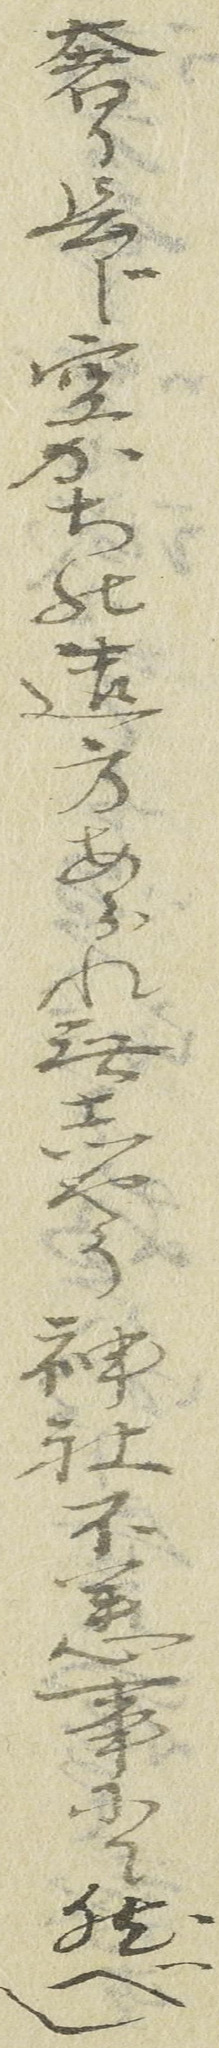奢り長じ空かちの造方あられ無しやう神社不恙事にて然べし

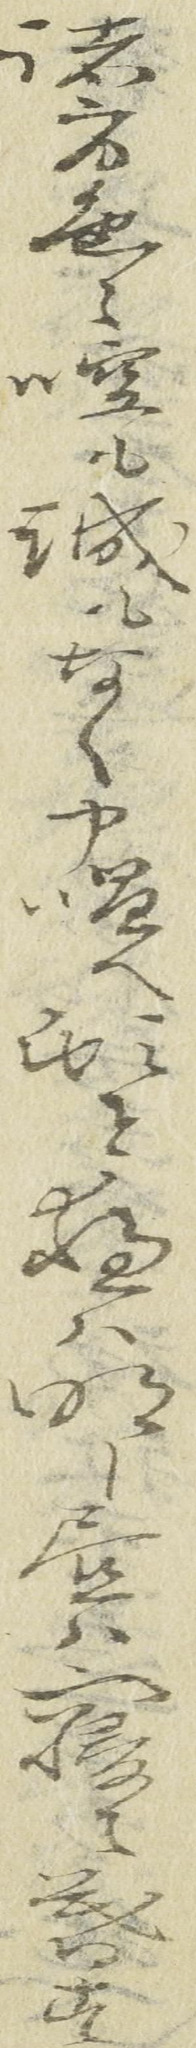諸方色々啌も誠もなく申唱へ頓と夜ハ明し昼ハ寝て暮す
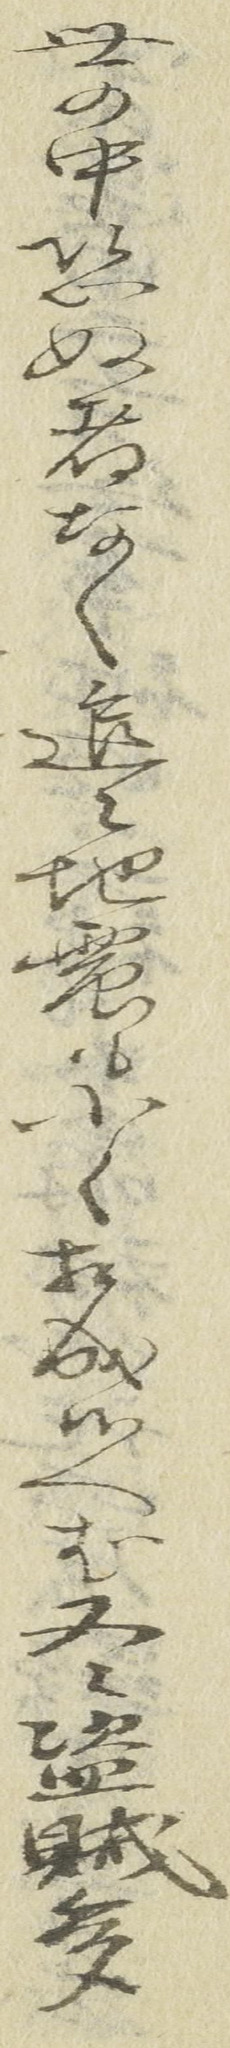世の中恐ぬ者なく追々地震も小く相成候へば又〻盗賊多
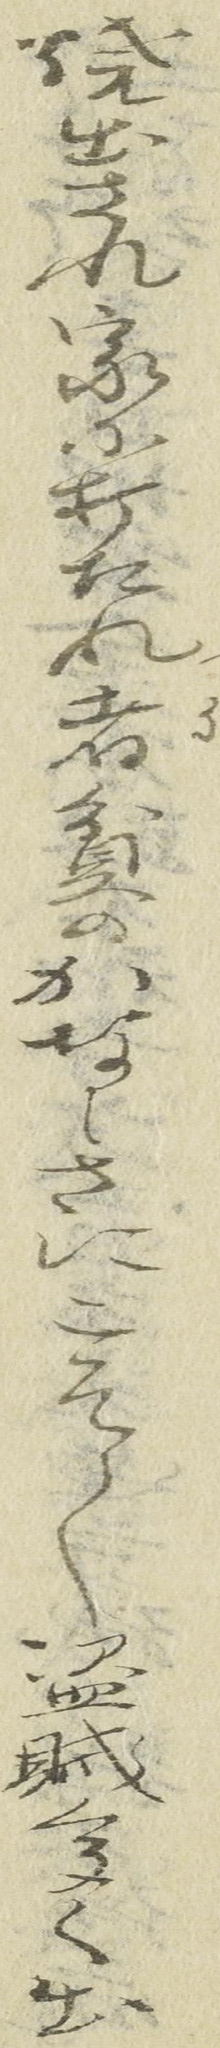焼出され家に打たれ者貧のかなしさにこそ〳〵盗賊多く出
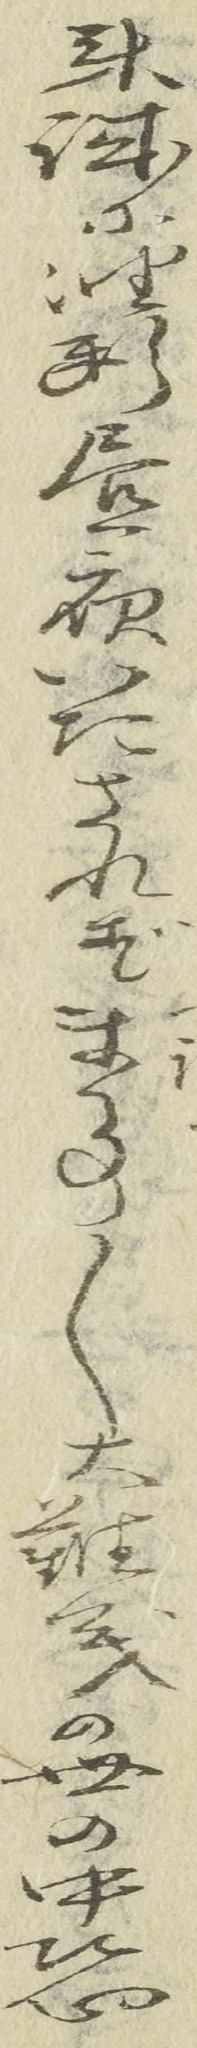来誠に油断昼夜いたされずま事〳〵大難義の世の中恐
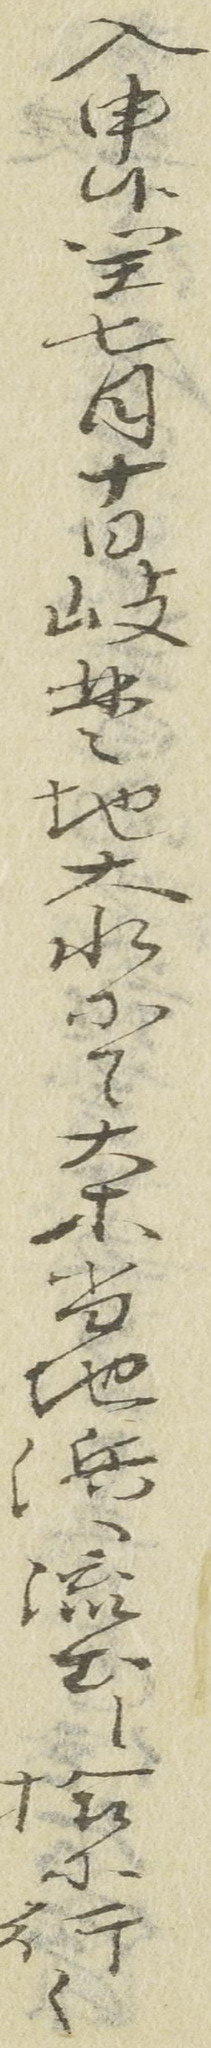入申し候閏七月十日岐楚地大水にて大木当地浜へ流出し拾に行く
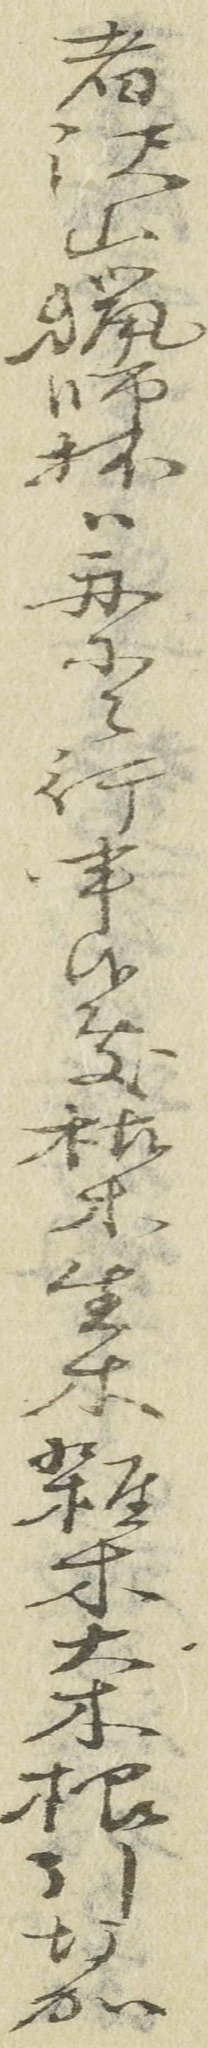者沢山猟師抔は舟にて行申候處植木生木雑木大木根引なか
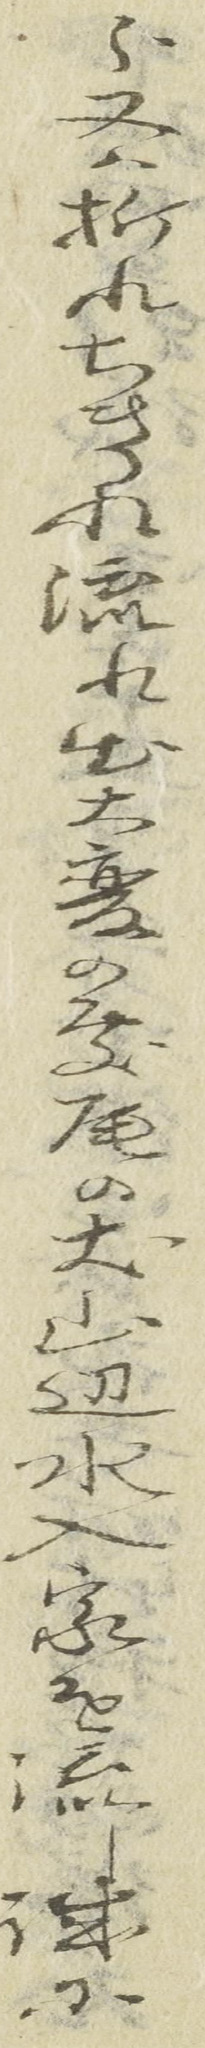ら又ハ折れちきれ流れ出大変の處尾の犬山辺水入家を流し誠に
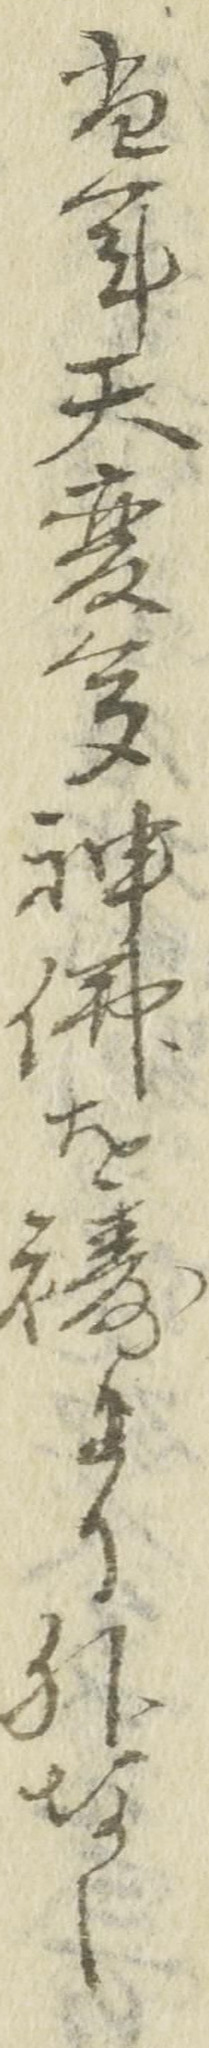当年天変多神佛を祷より外なし
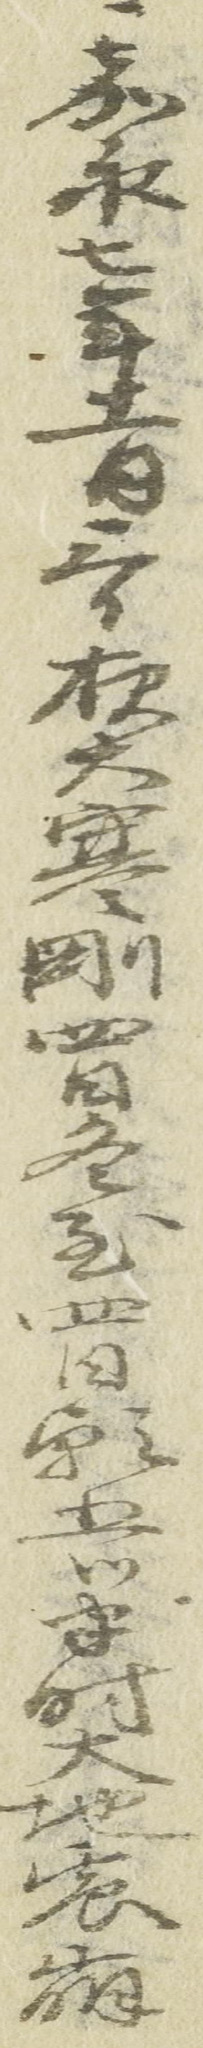一嘉永七年十一月三日夜大寒剛四日冬至四日朝五ツ半時大地震崩
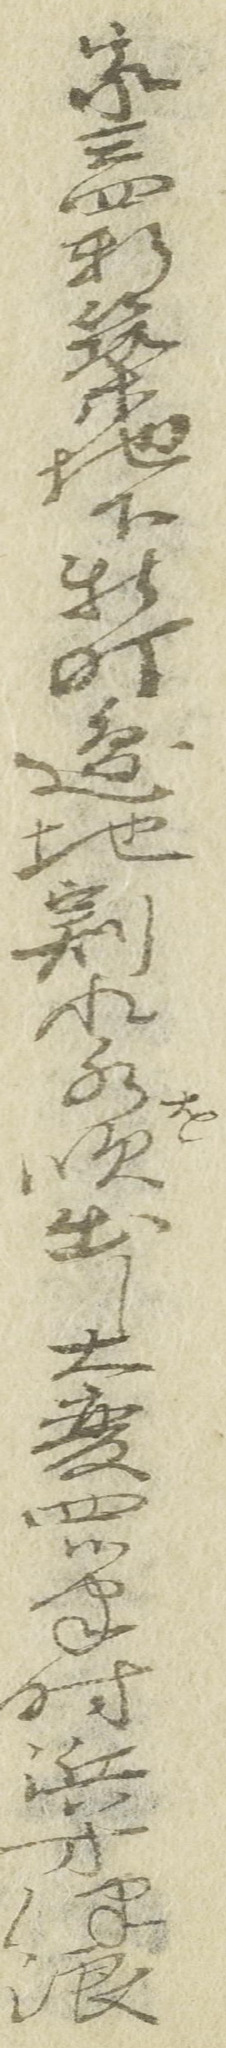家三四軒築地下新町邊地割れ水吹出し大変四ツ半時浜方津浪
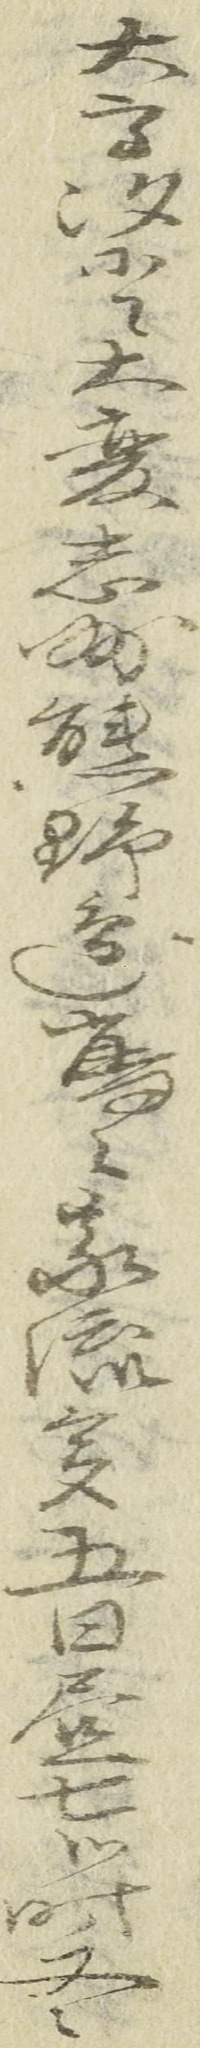大高汐にて大変志州熊野邊嶌々家流多五日昼七ツ時又〻
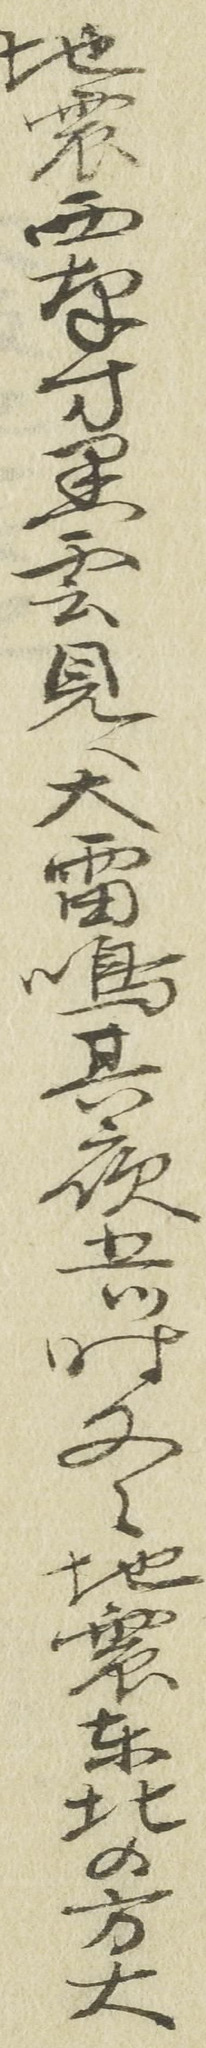地震西南方黒雲見へ大雷鳴其夜五ツ時又〻地震東北の方大
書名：地震前兆集　全
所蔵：東京大学地震研究所図書室 Earthquake Research Institute Library, The University of Tokyo, JAPAN
